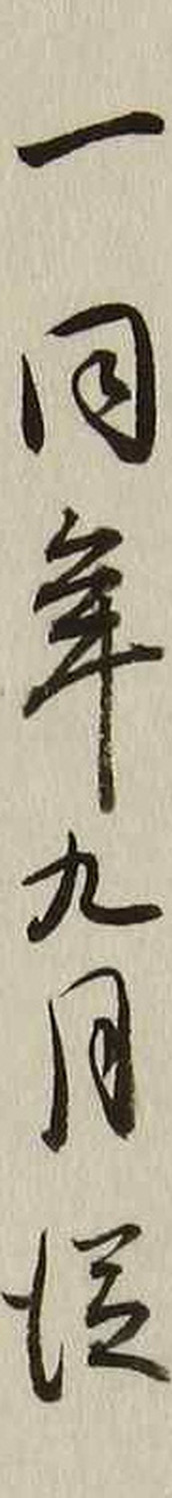一同年九月従
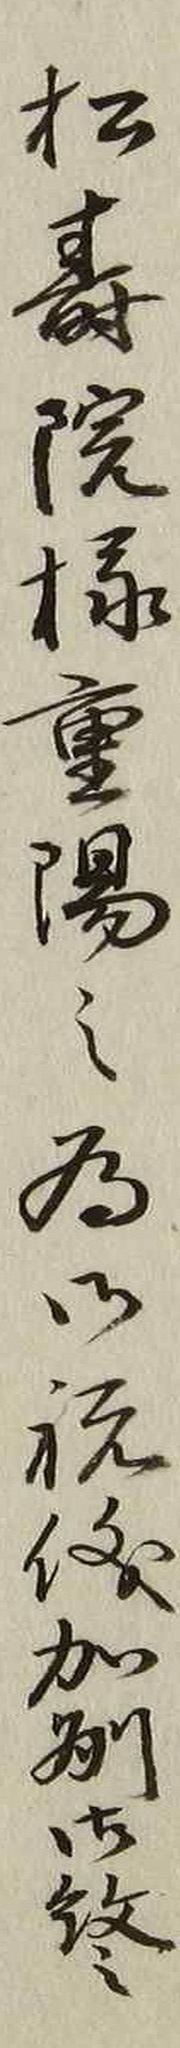松寿院様重陽之為御祝儀加州御紋之
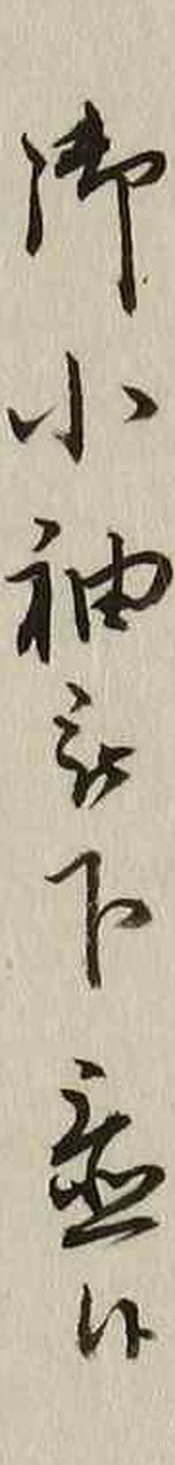御小袖被下置候
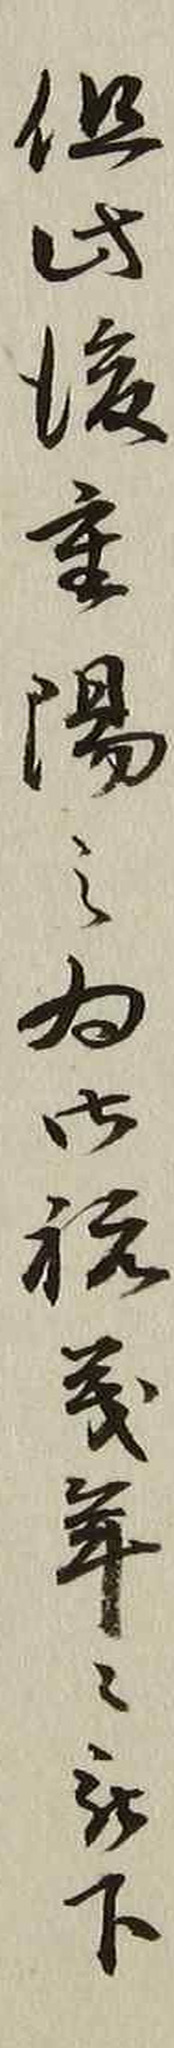但此後重陽之為御祝儀年々被下
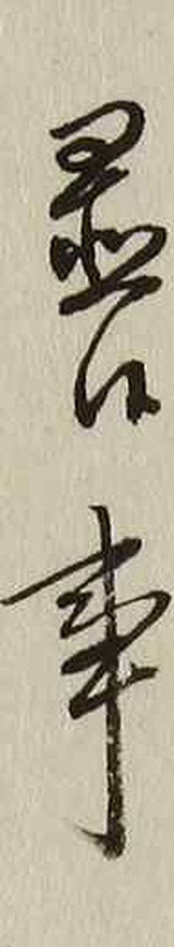置候事
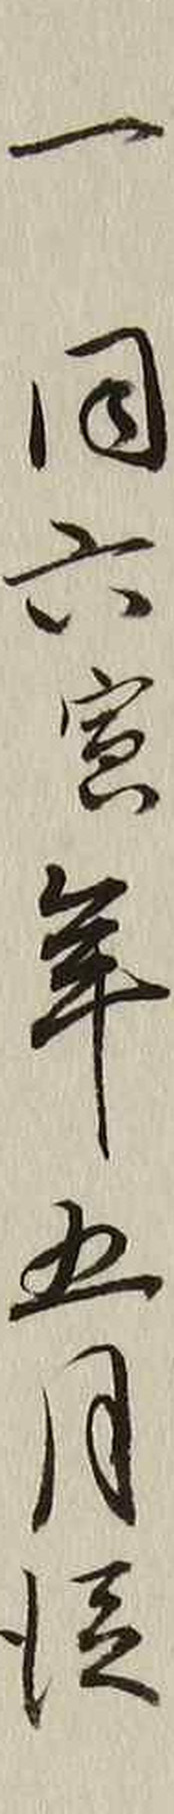一同六寅年五月従
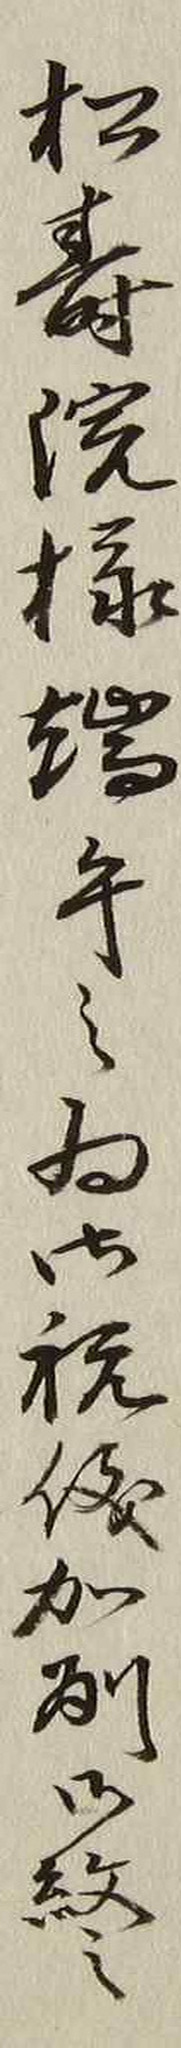松寿院様端午之為御祝儀加州御紋之
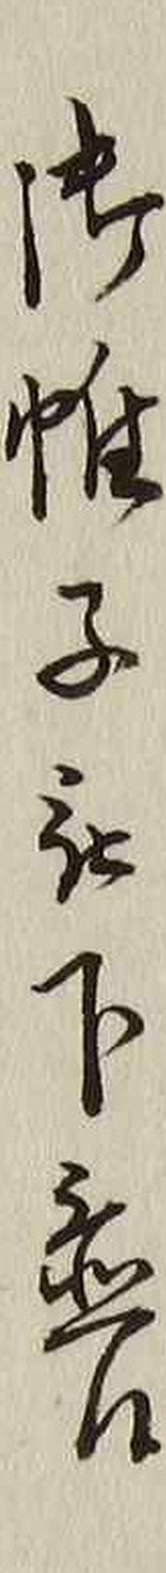御帷子被下置候
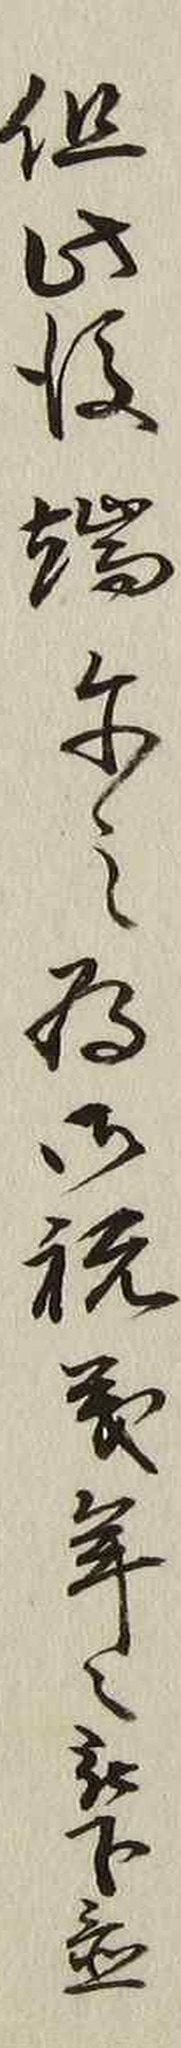但此後端午之為御祝儀年々被下置
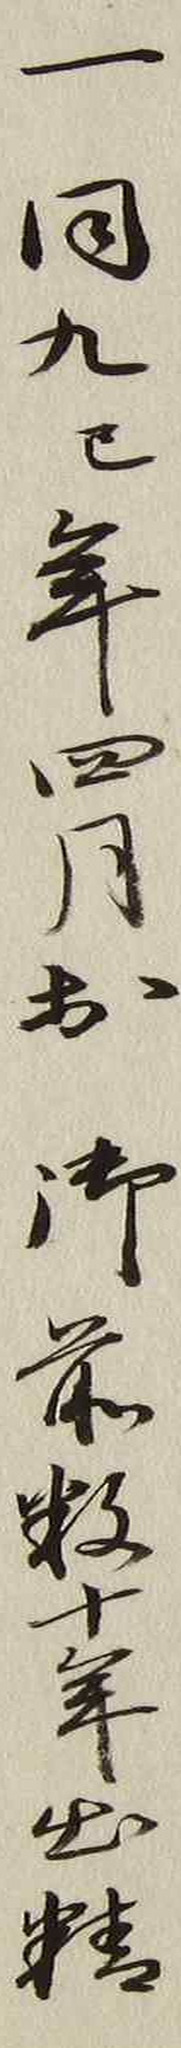一同九巳年四月於御前数十年出精
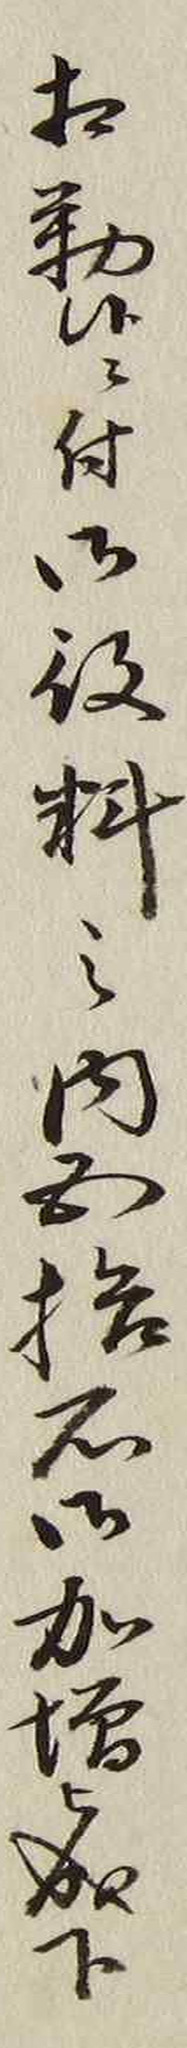相勤候ニ付御役料之内五拾石御加増被成下
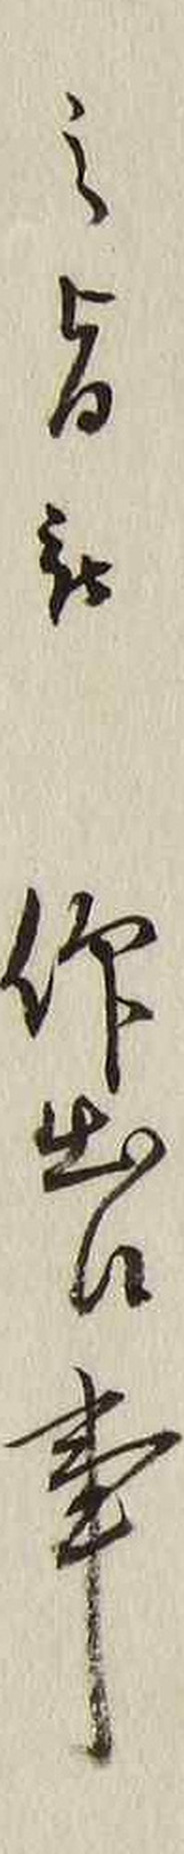之旨被仰出候事
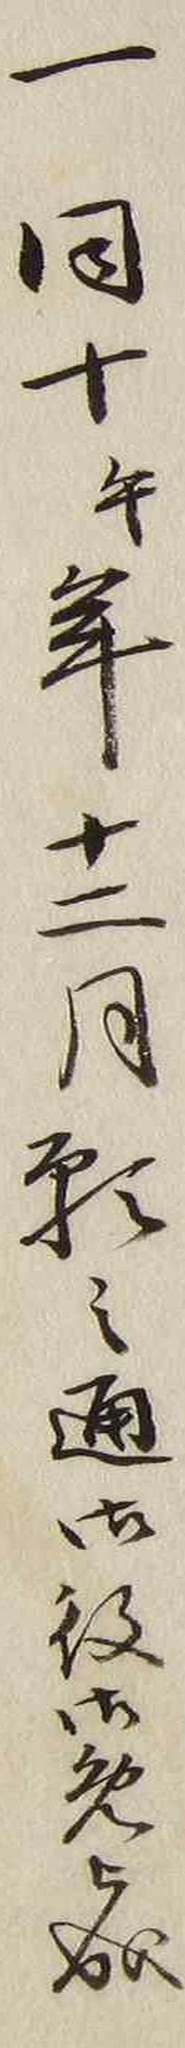一同十午年十二月願之通御役御免被成

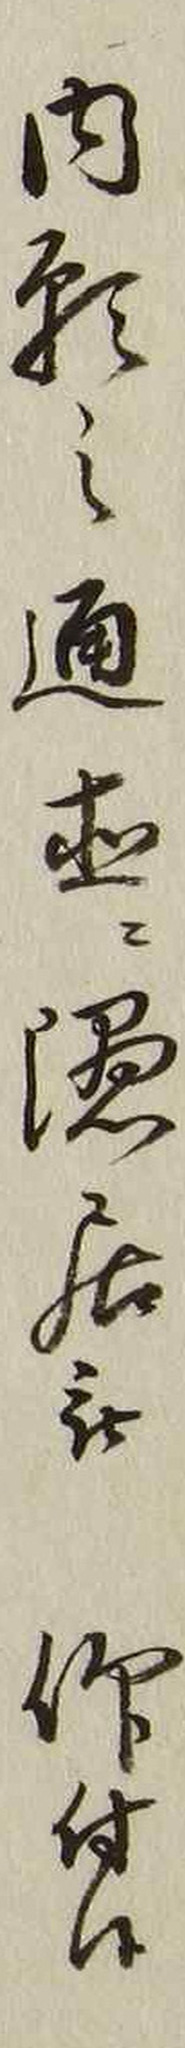内願之通直ニ隠居被仰付候
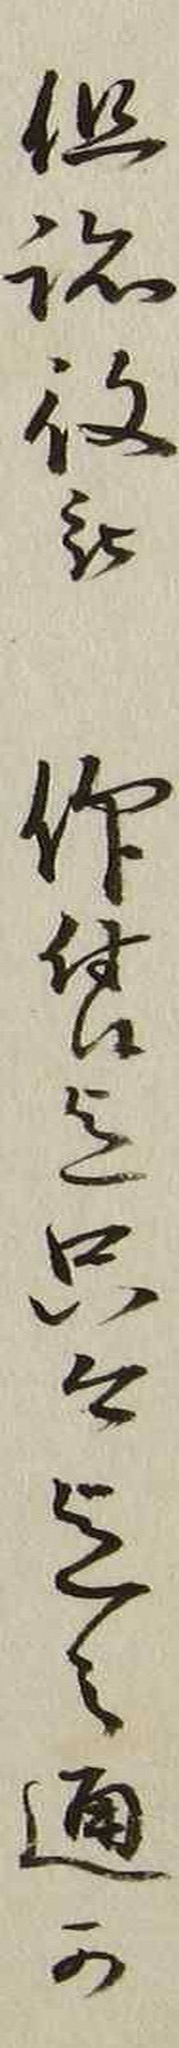但跡役被仰付候迄只今迄之通可
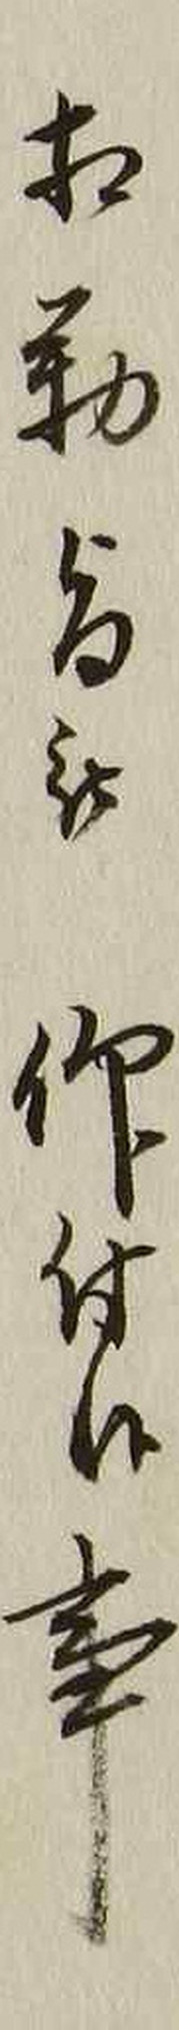相勤旨被仰付候事
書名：諸士系譜　巻之160　な之部2
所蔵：会津若松市立会津図書館
